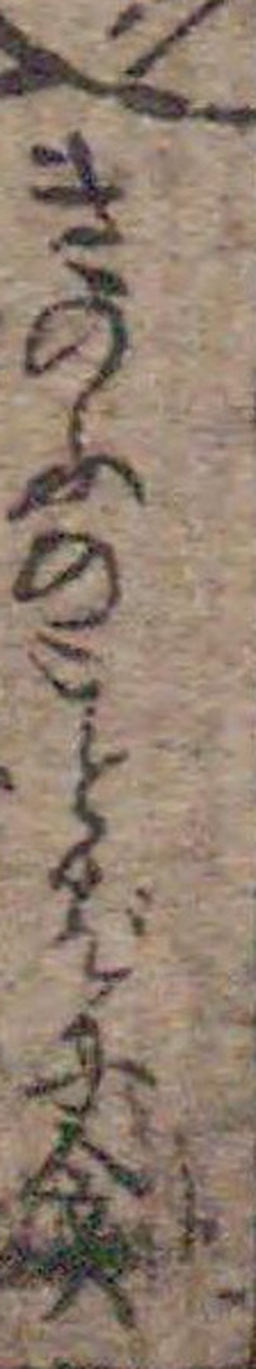きのふのことばに今は
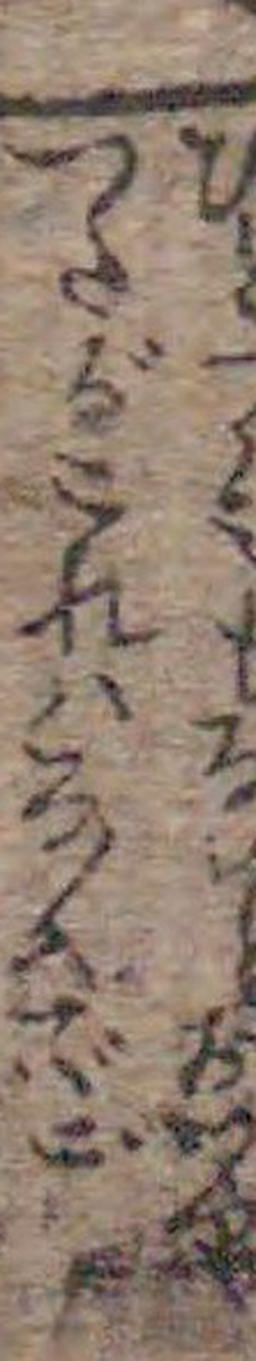つたがこれはなんでご
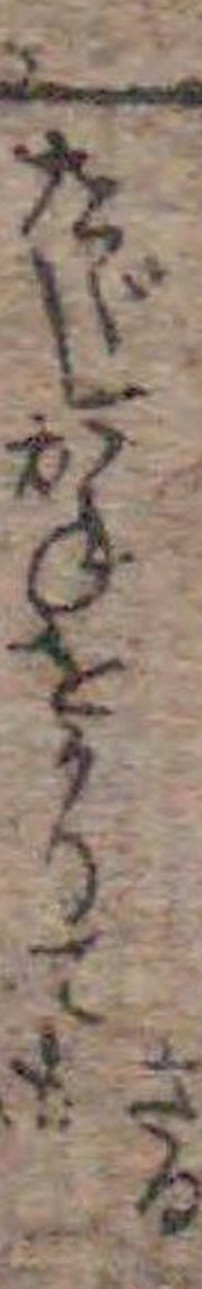たゞしかねをかりても
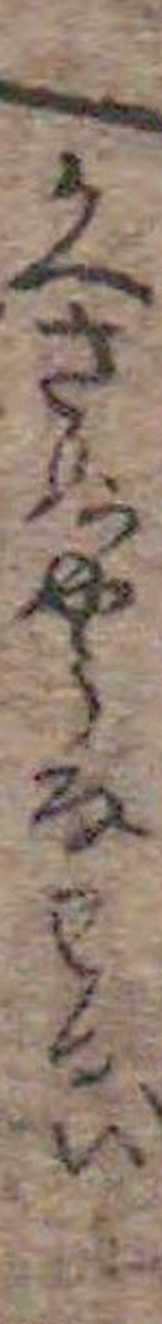かへさぬやうなわるい
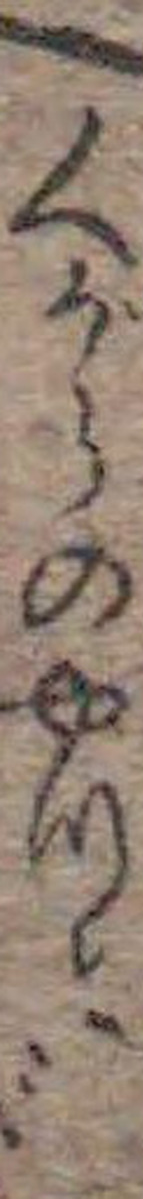人がらのやつと
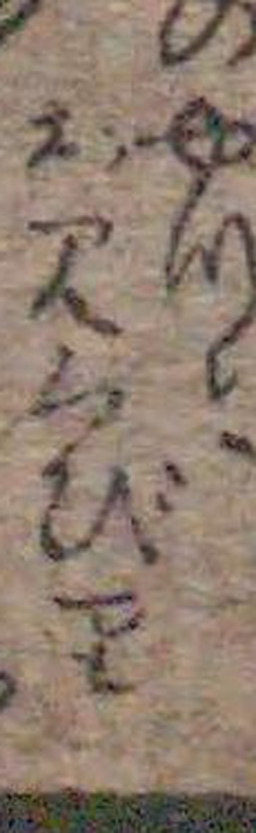お見くびり
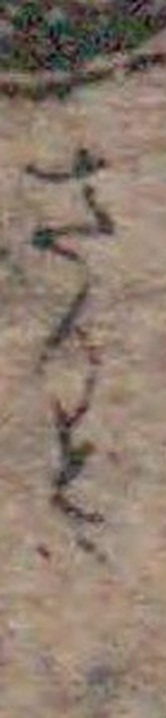さりとは
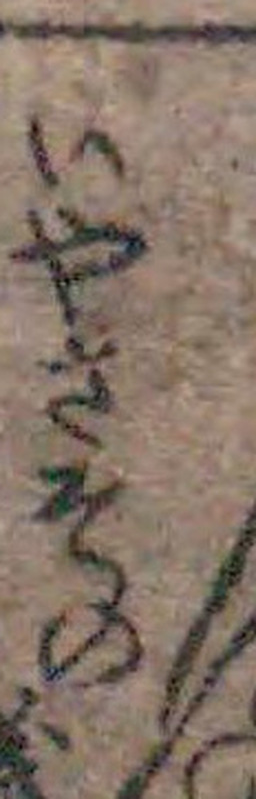いやさその
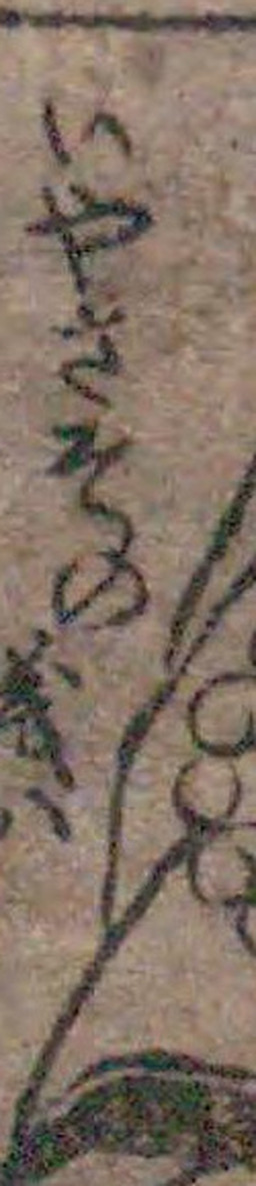いやさその
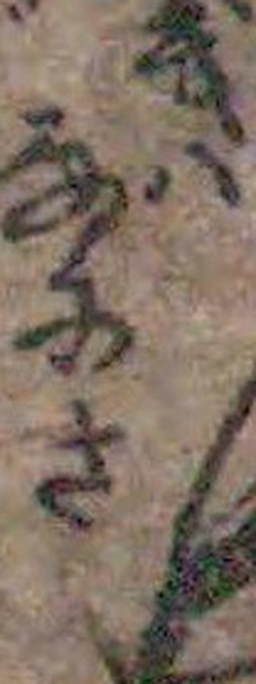なにさ
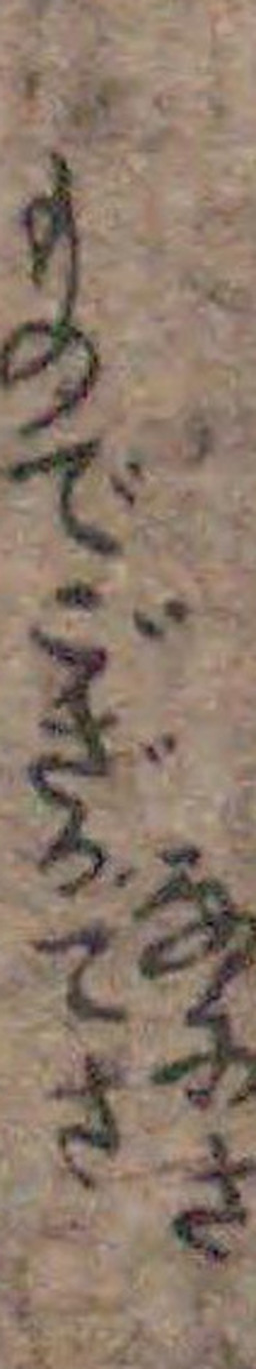ものでござつ？てさ
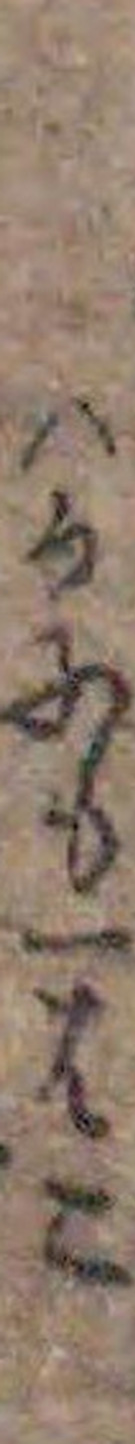はか？にも一はこ

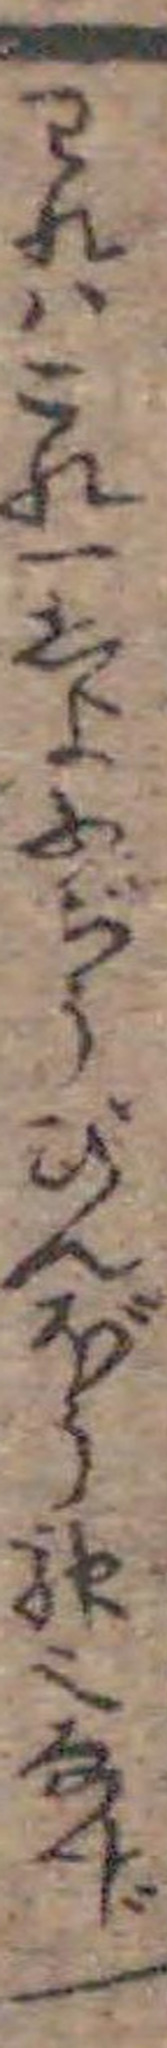われはこれ一しよふぢうびんぼう神也なんじ
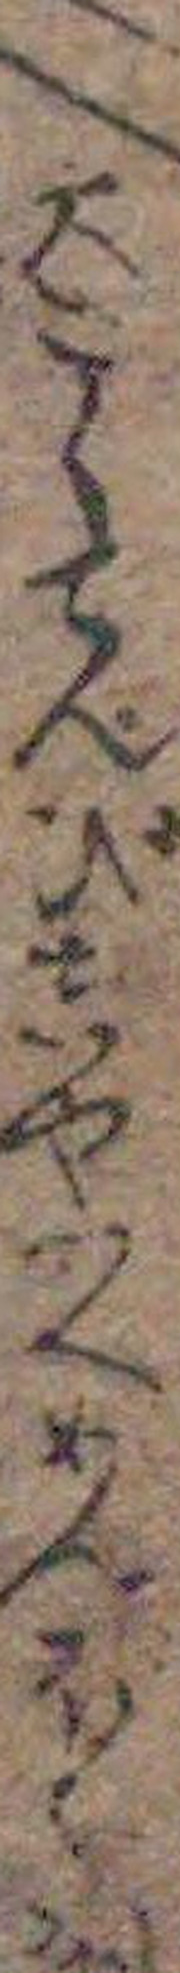大こくてんびしやもんめんぼくな
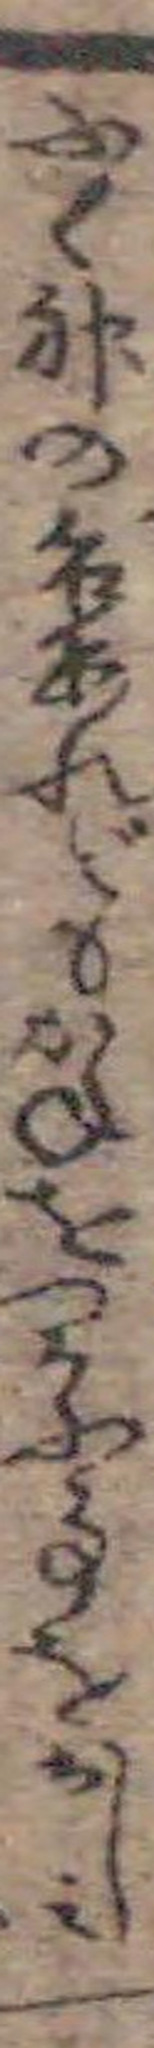ふく神の名あれどもかねをつかふ事をおしみ
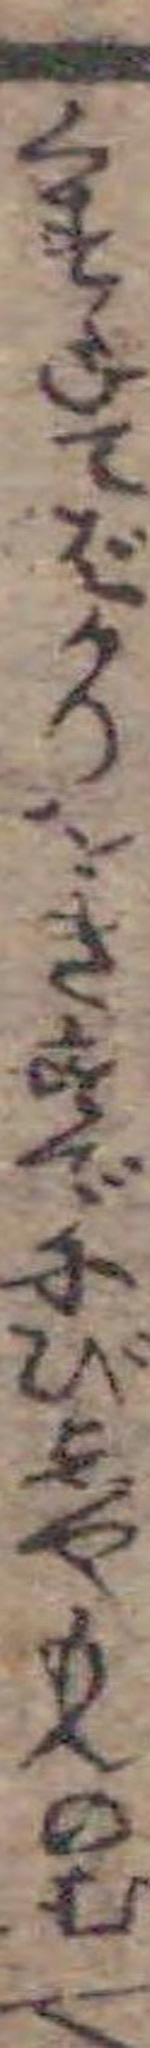くすねてばかりをきすでにびしやもんのむ
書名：蛭子大黒壮年過 : 2巻
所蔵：国立国会図書館 National Diet Library, JAPAN
